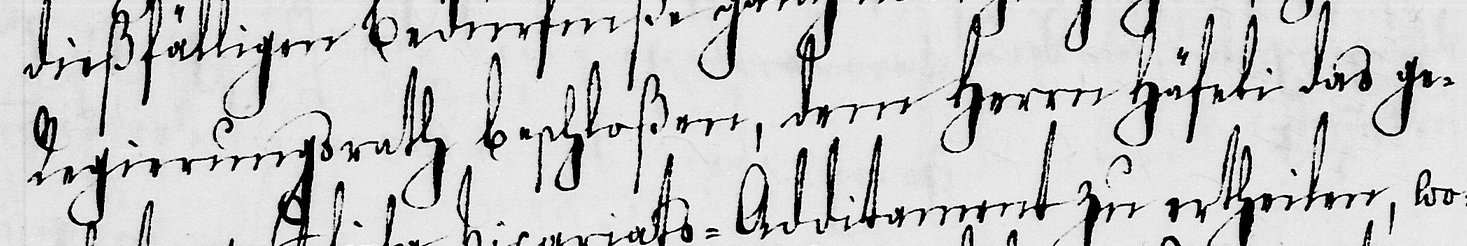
Regierungsrath beschloßen, dem Herrn Häfeli das ge¬
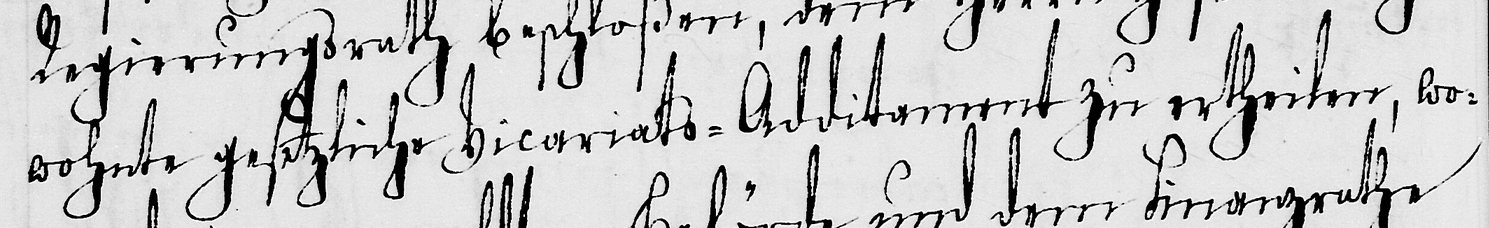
wohnte gesetzliche Vicariats-Additament zu ertheilen, wo¬
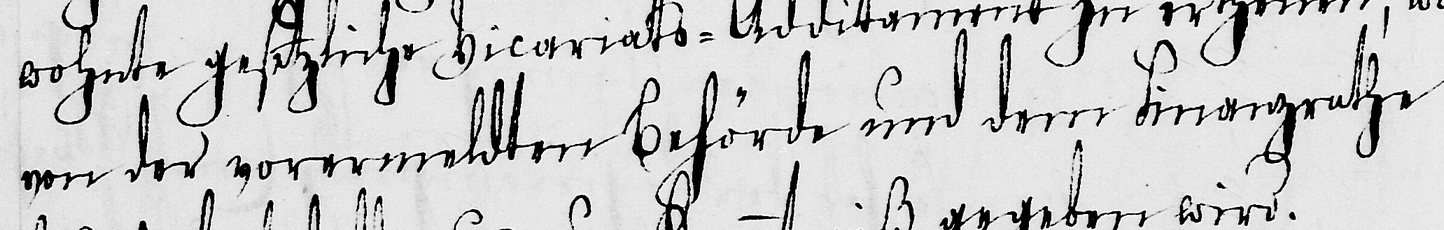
von der vorermeldten Behörde und dem Finanzrathe
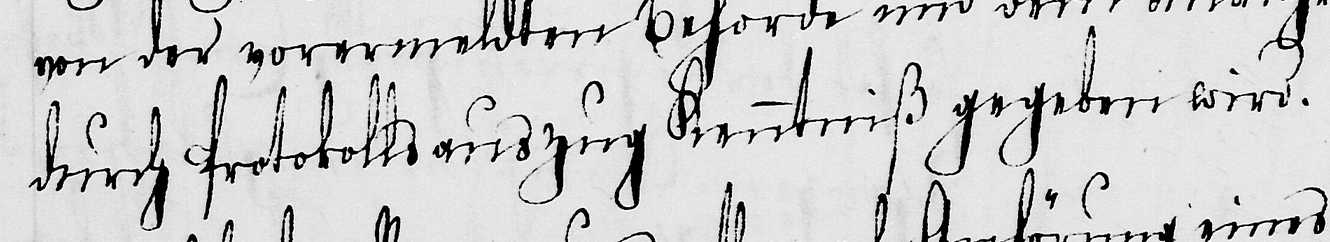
durch Protokollsauszug Kenntniß gegeben wird.
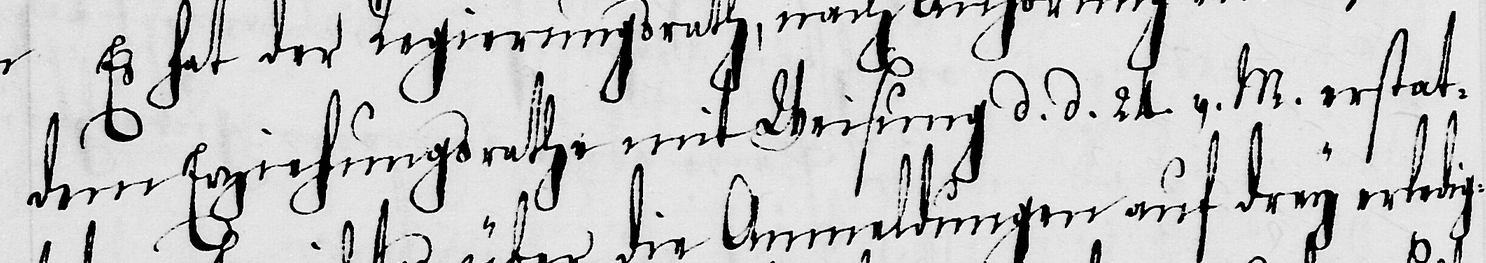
dem Erziehungsrathe mit Weisung d. d. 24. v. M. ersta¬
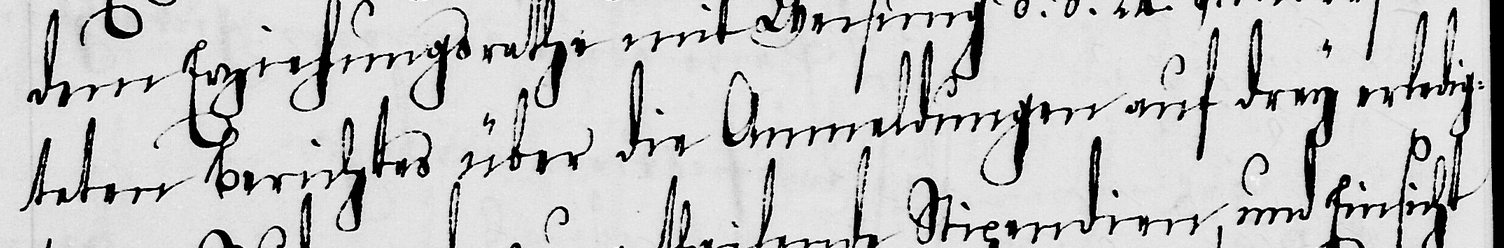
teten Berichtes über die Anmeldungen auf drey erledi¬
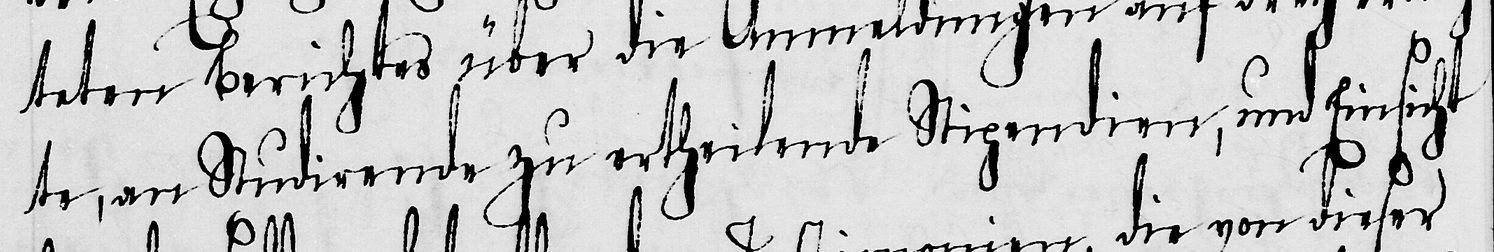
gte, an Studirende zu ertheilende Stipendien, und Einsic¬
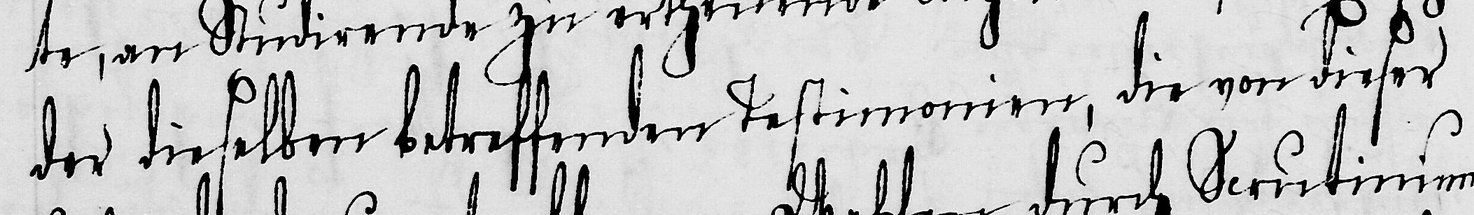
der dieselben betreffenden Testimonien, die von dieser
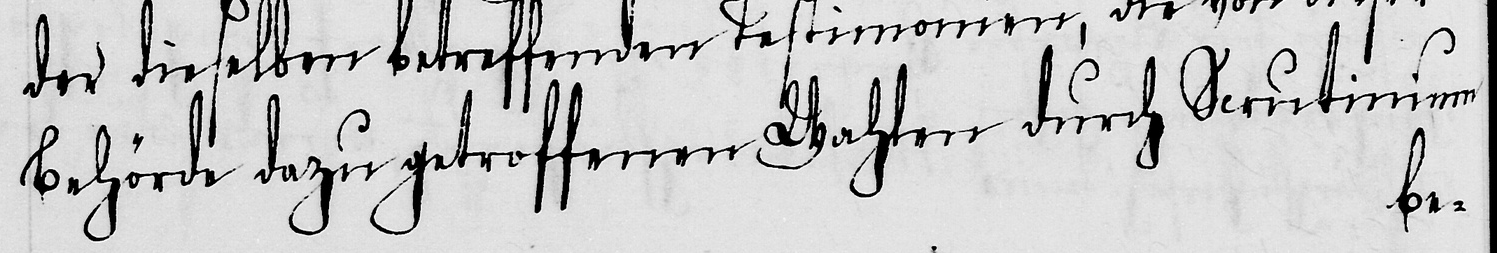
Behörde dazu getroffenen Wahlen durch Scrutinium
